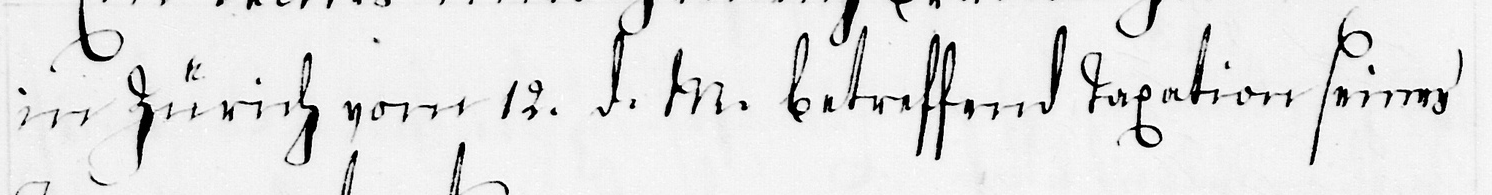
in Zürich vom 12. d. M. betreffend Taxation seines
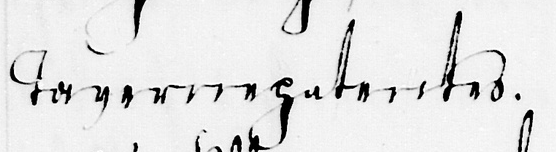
Tavernepatentes.
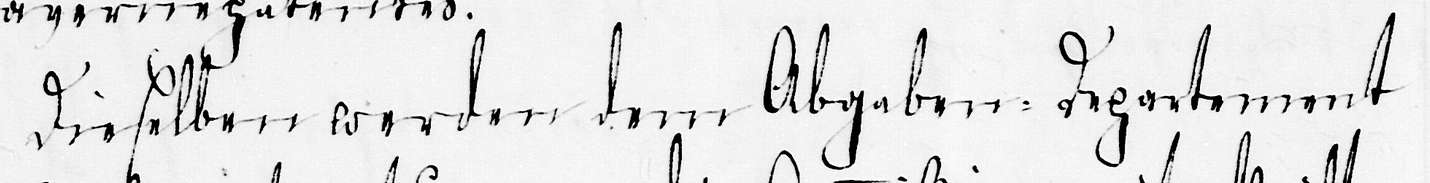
Dieselben werden dem Abgaben-Departement
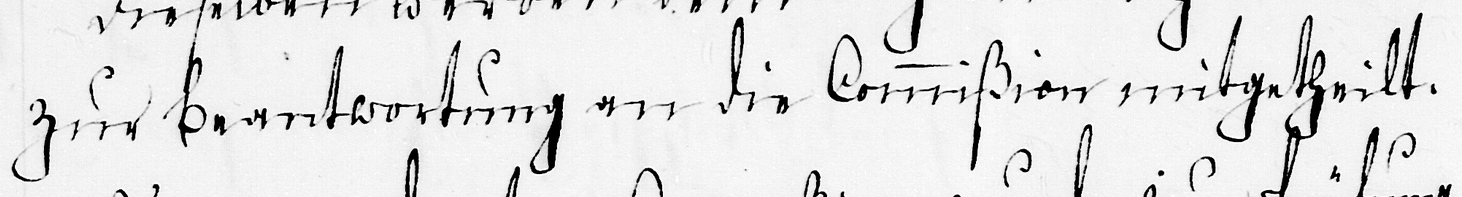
zur Beantwortung an die Commißion mitgetheilt.
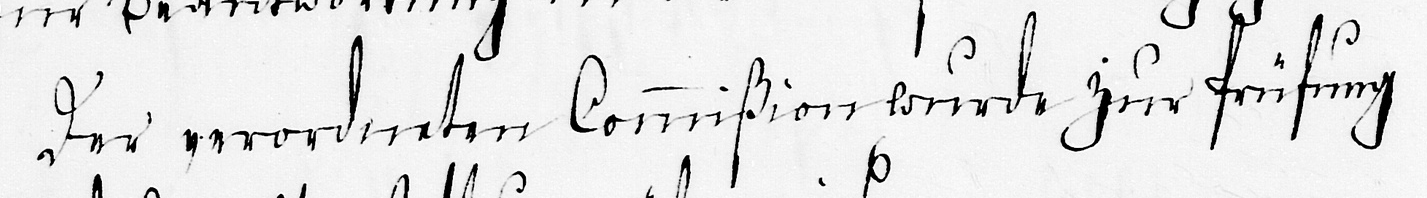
Der verordneten Commißion wurde zur Prüfung
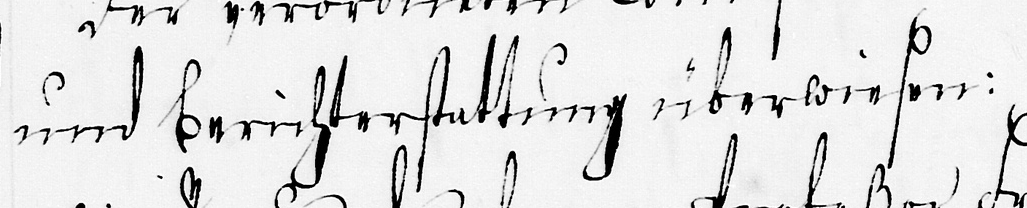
und Berichterstattung überwiesen:
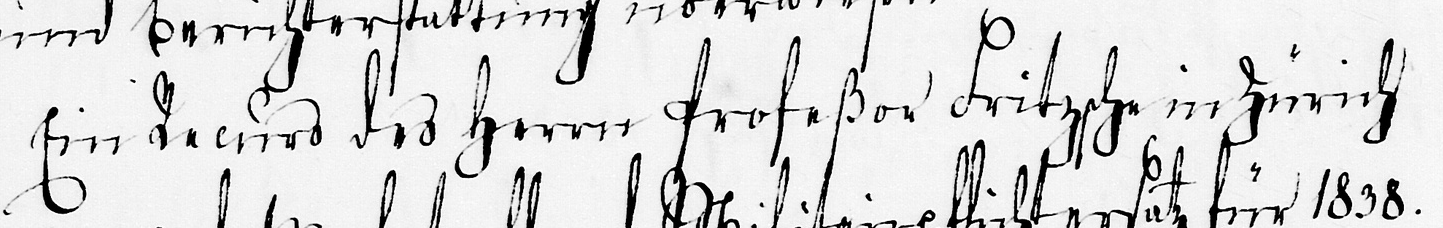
Ein Recurs des Herrn Profeßor Fritzsche in Zürich
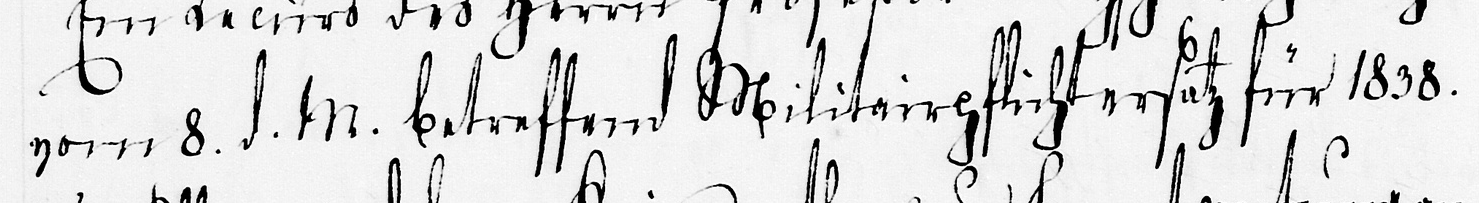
vom 8. d. M. betreffend Militairpflichtersatz für 1838.
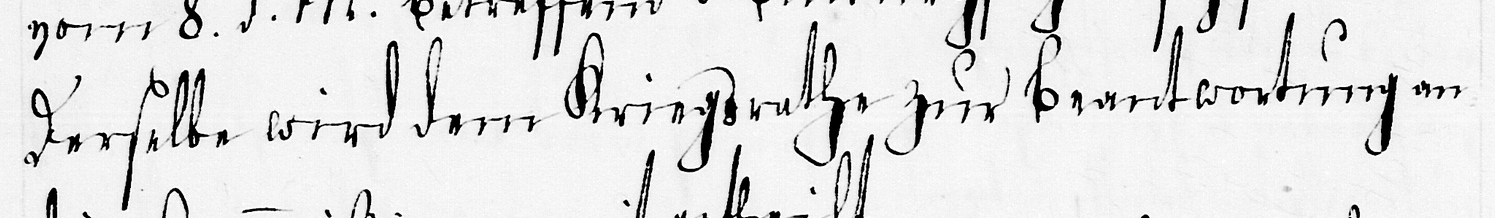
Derselbe wird dem Kriegsrathe zur Beantwortung an
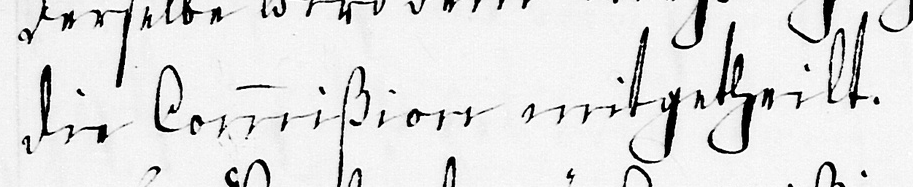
die Commißion mitgetheilt.
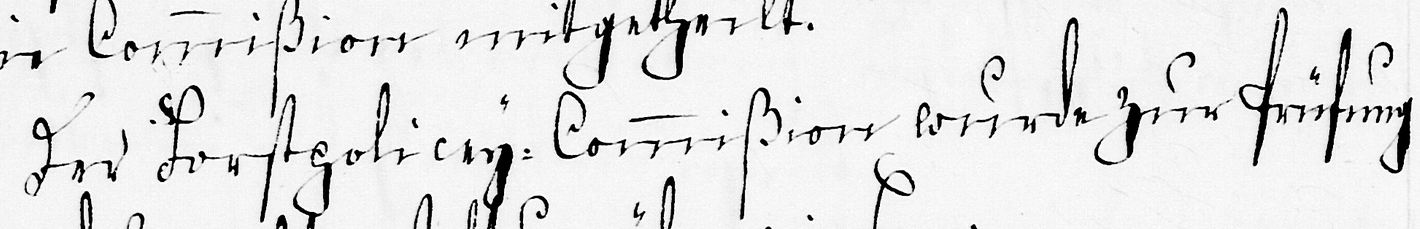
Der Forstpolicey-Commißion wurde zur Prüfung
